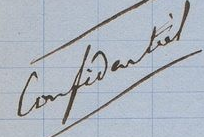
Monsieur
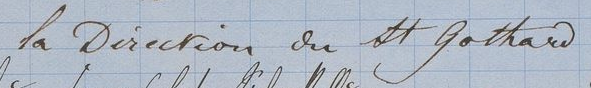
la Direction du St Gothard à
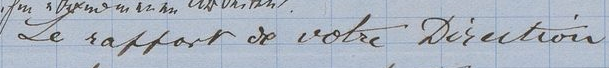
Le rapport de votre Direction
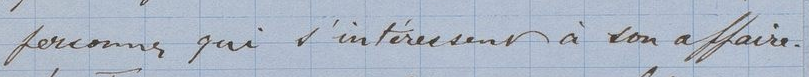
personnes qui s'intéressent à son affaire.
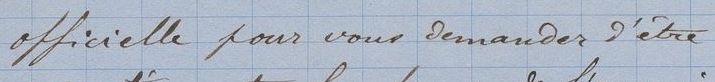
officielle pour vous demander d'être
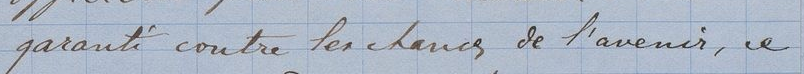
garanti contre les chances de l'avenir, ce
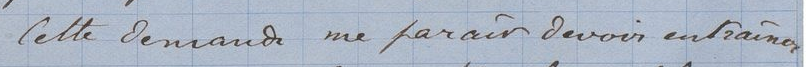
Cette demande me paraît devoir entraîner
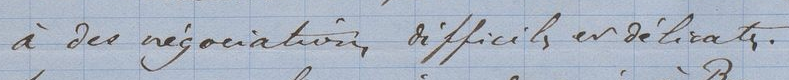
à des négociations difficiles et délicates.
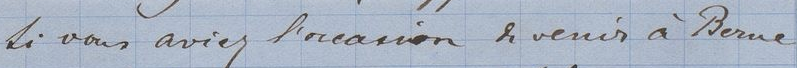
Si vous aviez l'occasion de venir à Berne
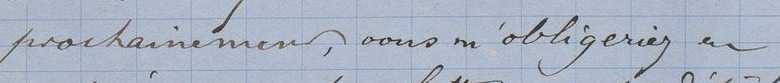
prochainement, vous m'obligeriez en
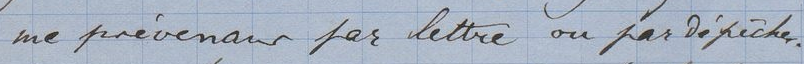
me prévenant par lettre ou par dépêche.
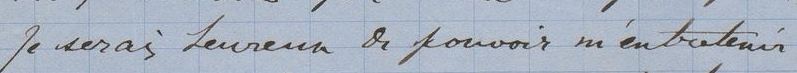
Je serais heureux de pouvoir m'entretenir
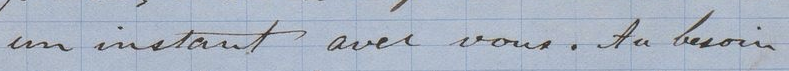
un instant avec vous. Au besoin
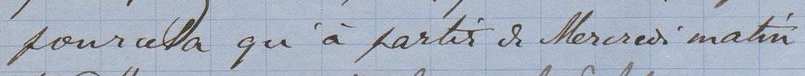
pour cela qu'à partir de Mercredi matin
